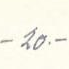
20
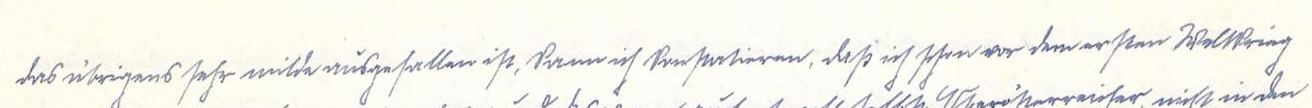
das übrigens sehr milde ausgefallen ist kann nicht konstatieren, dass ich schon vor dem ersten Weltkrieg
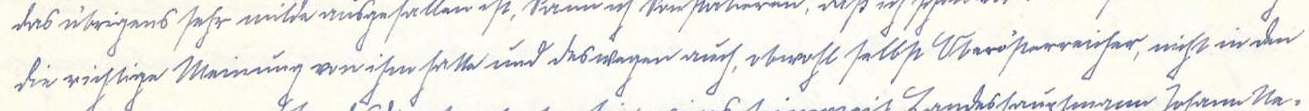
die richtige Meinung von ihm hatte und deswegen auch, obwohl selbst Oberösterreicher, nicht in den
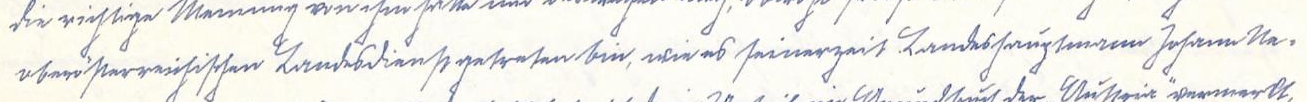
oberösterreichischen Landesdienst getreten bin, wie es seinerzeit Landeshauptmann Johann Ne-
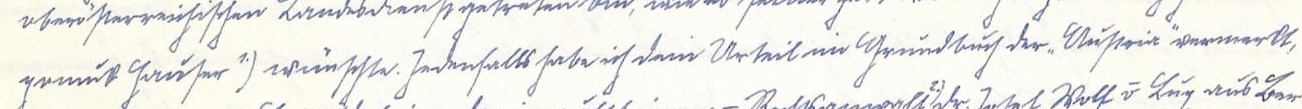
pomuk Hauser 1) wünschte. Jedenfalls habe ich dein Urteil im Grundbuch der Austria vermerkt,
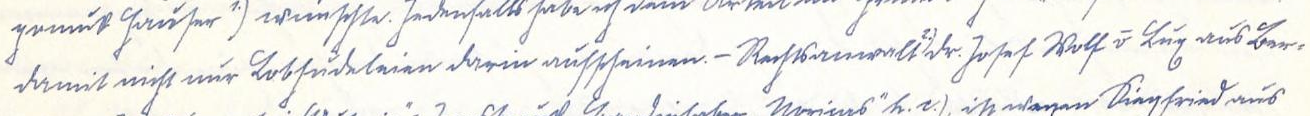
damit nicht nur Lobhudeleien darin aufscheinen. - Rechtsanwalt 2) Dr. Josef Wolf v/o Lutz aus Ber-
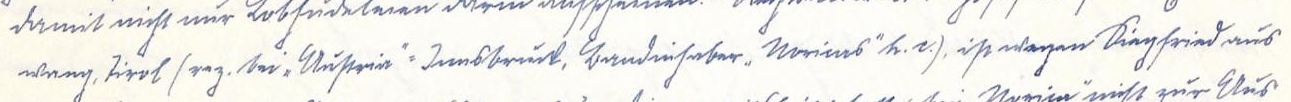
wenig, Tirol (rez. bei Austria Innsbruck, Bandinhaber „Noricas“ h. c.) ist wegen Siegfried aus
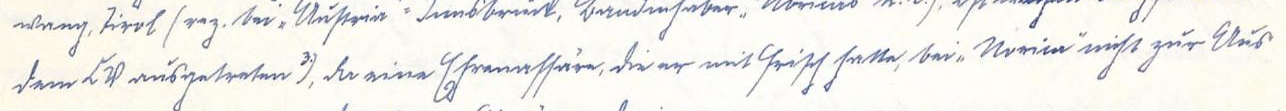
dem CV ausgetreten 3), da eine Ehrenaffäre, die er mit Frisch hatte, bei „Norica“ nicht zur Aus-
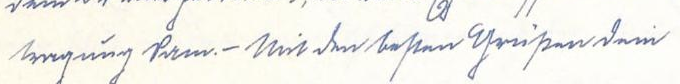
tragung kann. - Mit den besten Grüßen dein
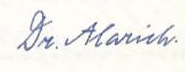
Dr. Alarich
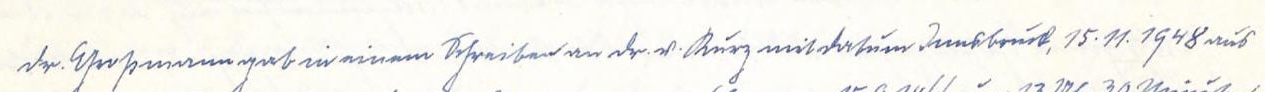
Dr. Großmann in einem Schreiben an Dr. von Kurz mit datum Innsbruck, 15.11.1948 aus
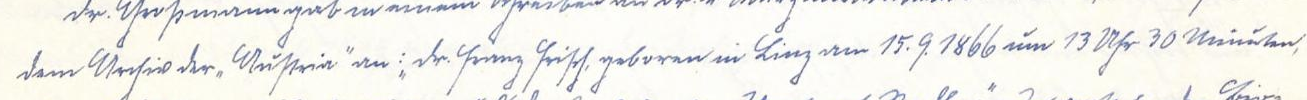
dem Archiv der Austria an: „Dr. Franz Frisch, geborenen in Linz am 15. 9. 1866 um 13 Uhr 30 Minuten
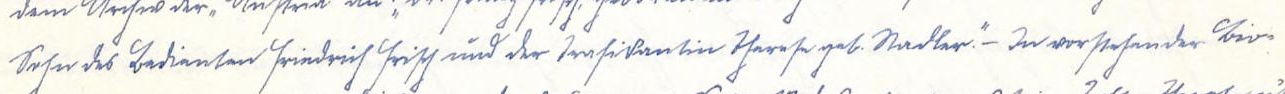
Sohn des Bedienten Friedrich Frisch und der Trafikantin Therese geborene Stadler“. - In vorstehender Bio-
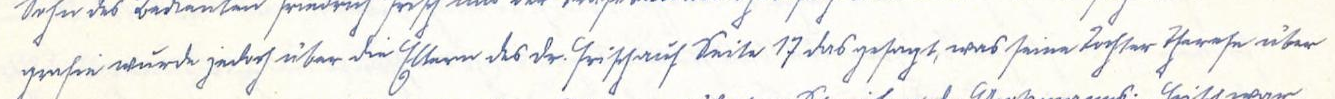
grafie wurde jedoch über die Eltern des Dr. Frisch auf Seite 17 das gesagt, was seine Tochter Therese
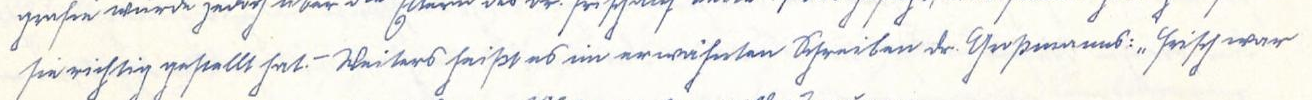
über sie richtig gestellt hat.- Weiters heißt es im erwähnten Schreiben Dr. Großmanns: „Frisch war
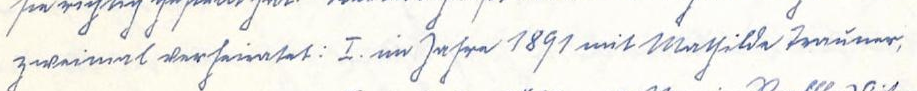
zweimal verheiratet: I im Jahre 1891 mit Mathilde Trauner,
